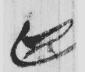臣
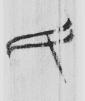民
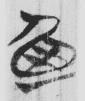廼
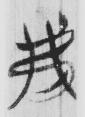弗
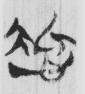{仌斤心}
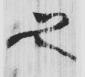氒
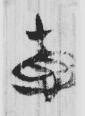惪
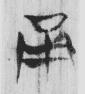甬
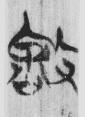{余口攴}
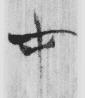才
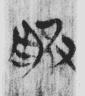服
